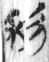利（利）
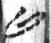㠯（以）
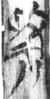祭
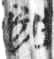門
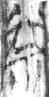行
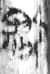○（除）
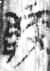疾
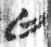㠯（以）
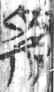祭
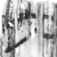大
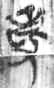事
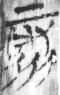聚
